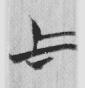上
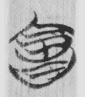會
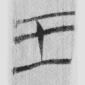王
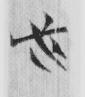必
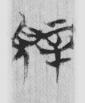親
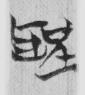聖
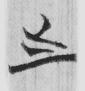之
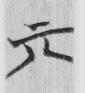亓
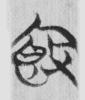{勹㿝攴}
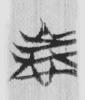者
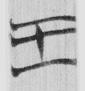王
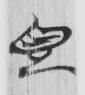見
